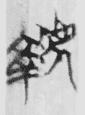{幸虎}
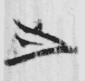之
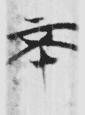不
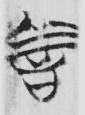善
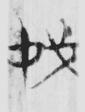{戈才}
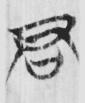君
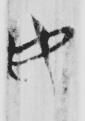女
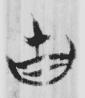由
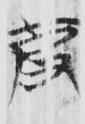皮
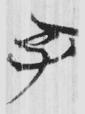孔
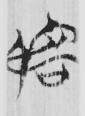{弔口}
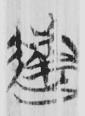{辶止㚔}
